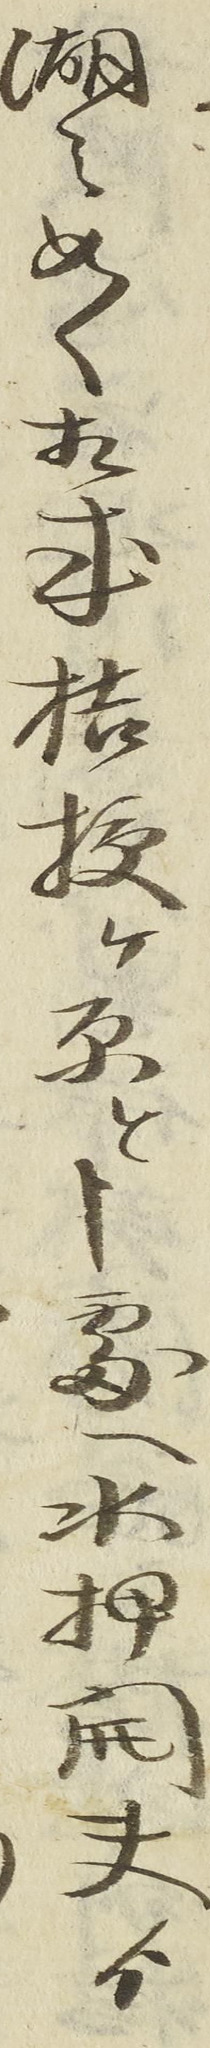湖之如く相成桔梗ヶ原と申処へ水押開夫ゟ
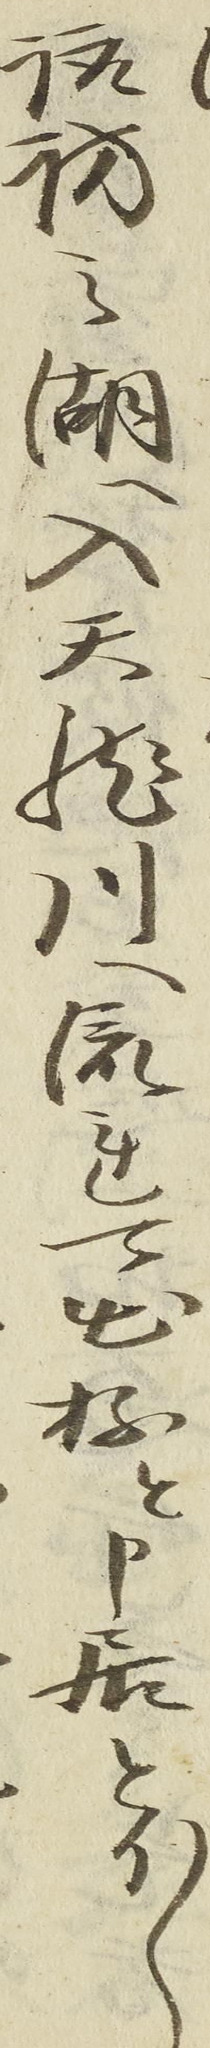諏訪之湖へ入天竜川へ流れ可出抔と申居とり〳〵
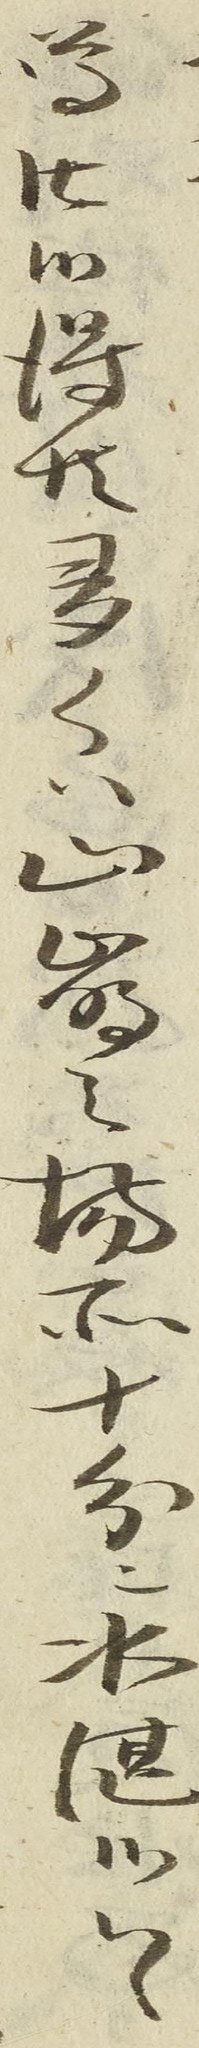噂仕候得共多くハ山崩之場所十分二水湛候ハゝ
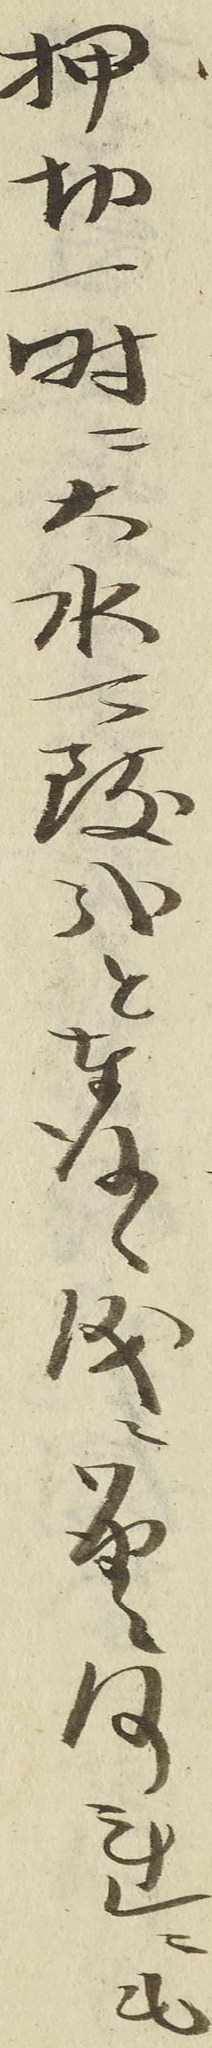押切一時二大水可致哉と存候儀二御座候何れ二も
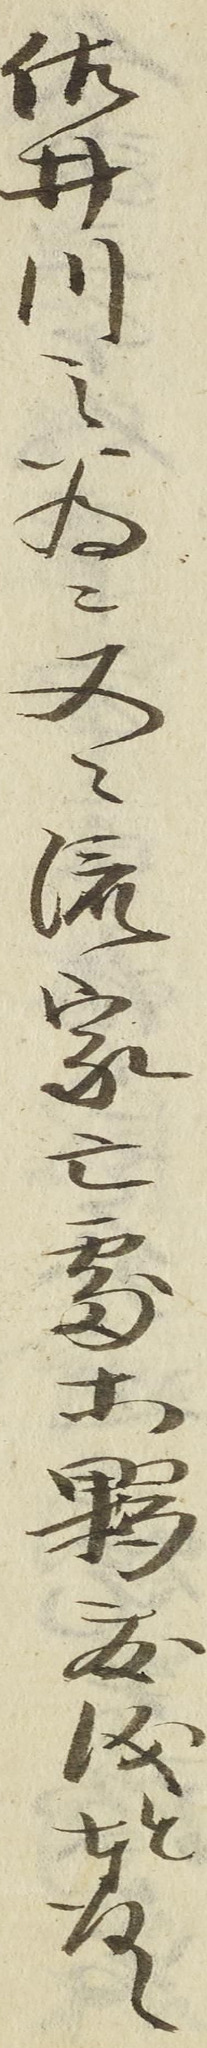佐井川之為二又々流家亡処等夥敷と奉存候
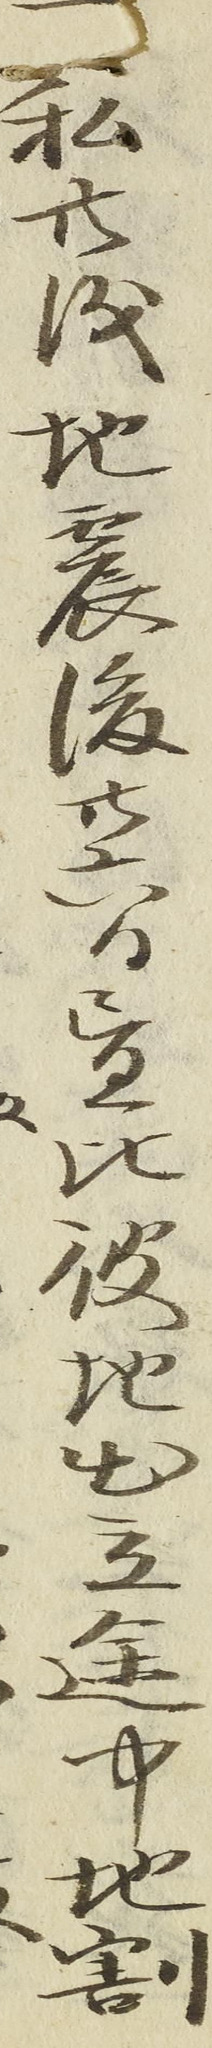一私共儀地震後廿六日昼比彼地出立途中地割
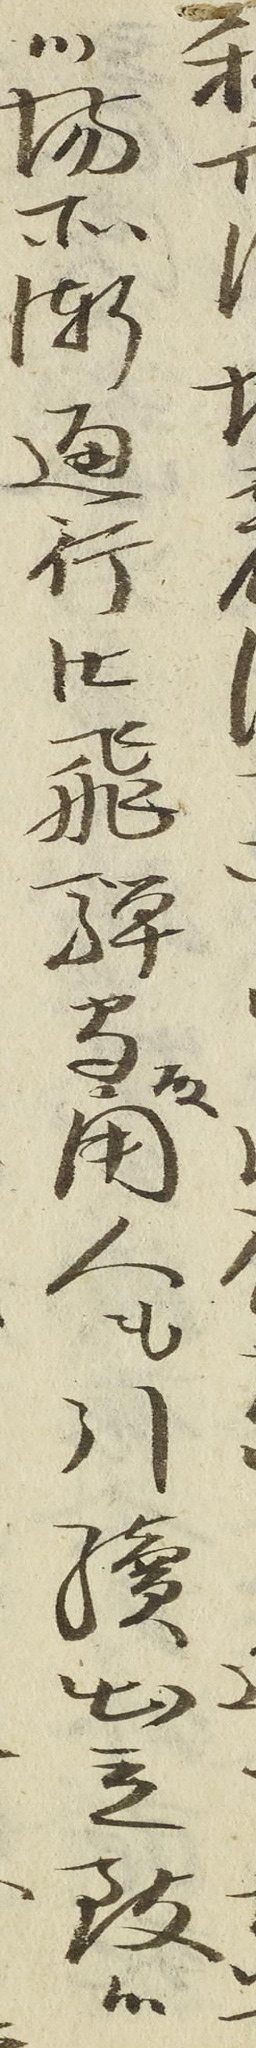候場所漸通行仕飛騨守殿用人も引続出立致候
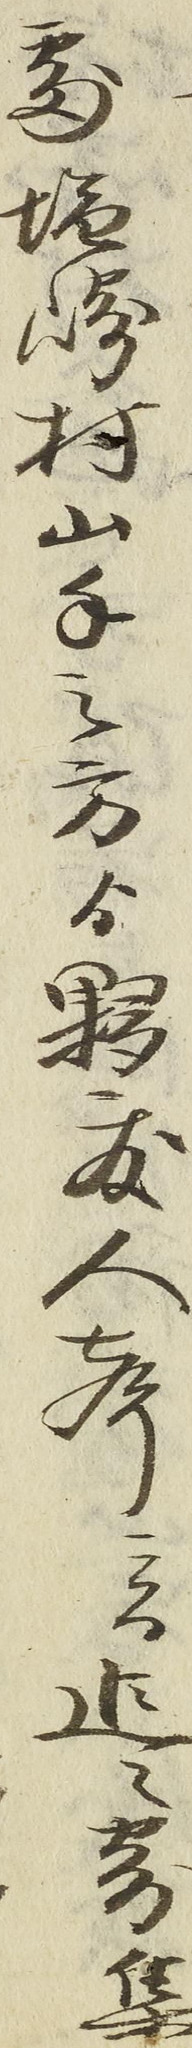処塩崎村山手之方ゟ夥敷人声二而追々寄集
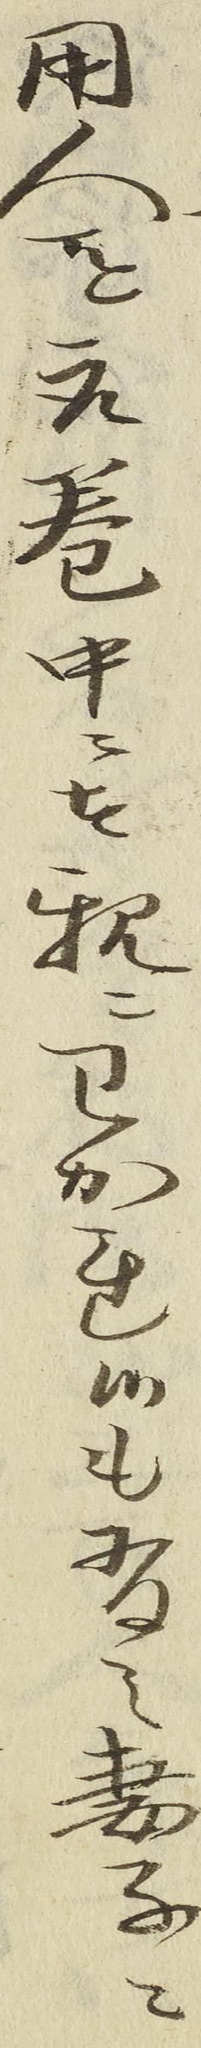用人を取巻中二は親二わかれ候も有之妻子二
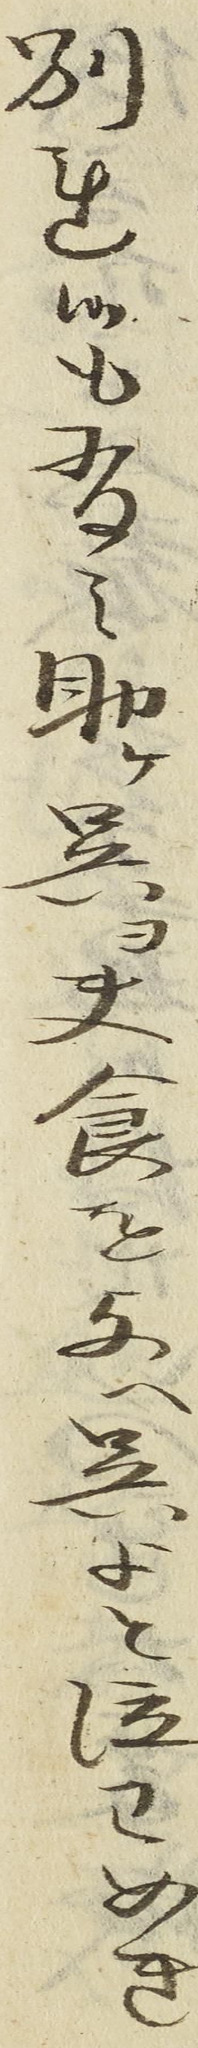別れ候も有之助ヶ呉ヨ夫食を与へ呉よと泣わめき
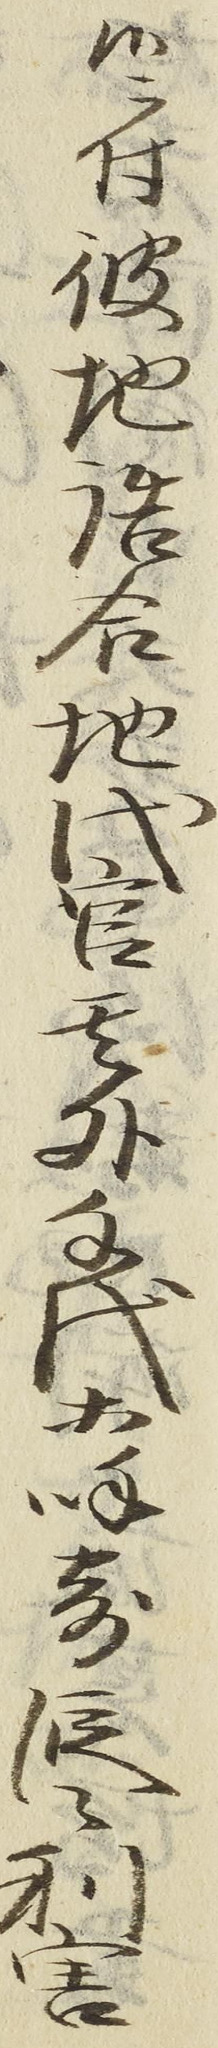候二付彼地詰合地代官其外手代相呼寄段々利害
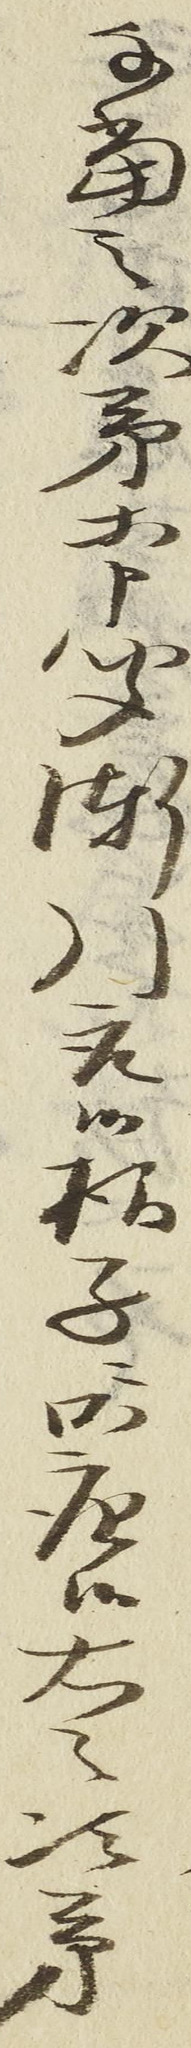手当方之次第等申聞漸引取候様子二御座候右之次第
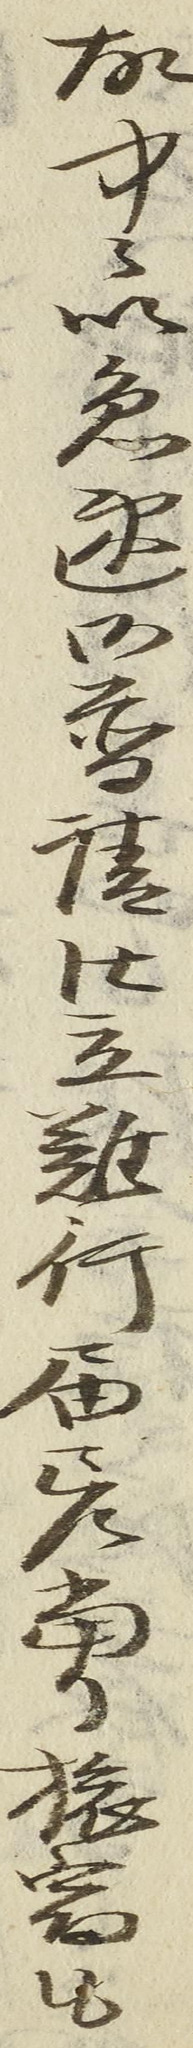故中々以急速御普請仕立難行届差当り旅宿は
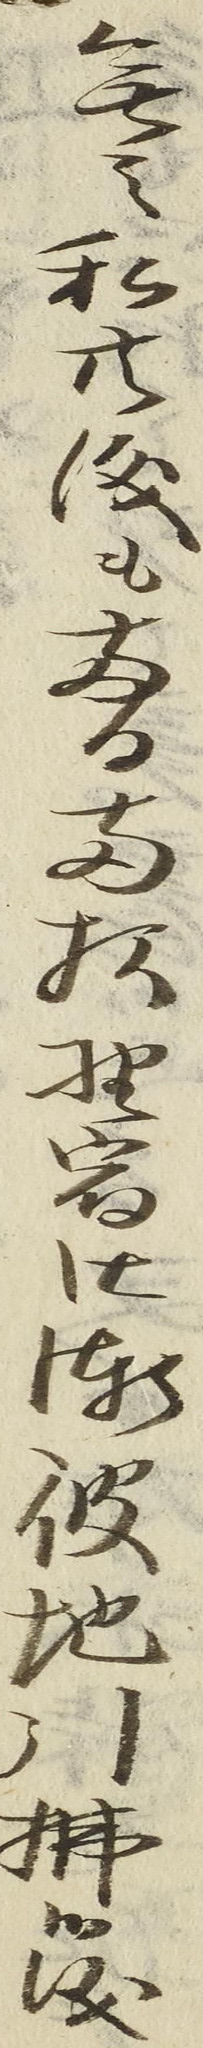無之私共儀も両日両夜野宿仕漸彼地引払候儀
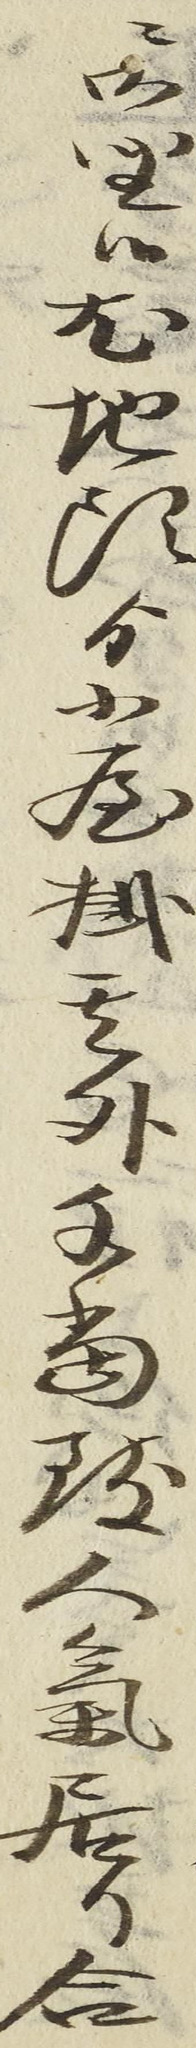二御座候尤地頭ゟ小屋掛其外手当致人気居り合
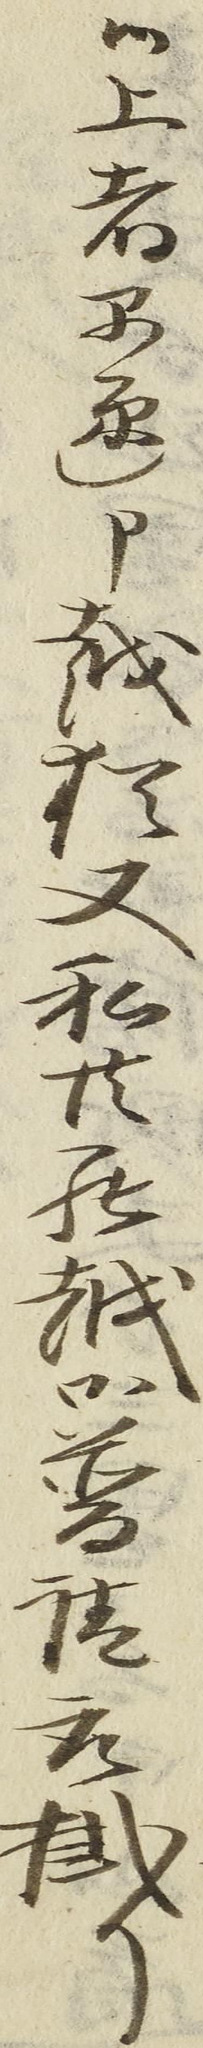候上は早速申越猶又私共罷越申御普請取掛り
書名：信濃國大地震記　乾
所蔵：東京大学地震研究所図書室 Earthquake Research Institute Library, The University of Tokyo, JAPAN
